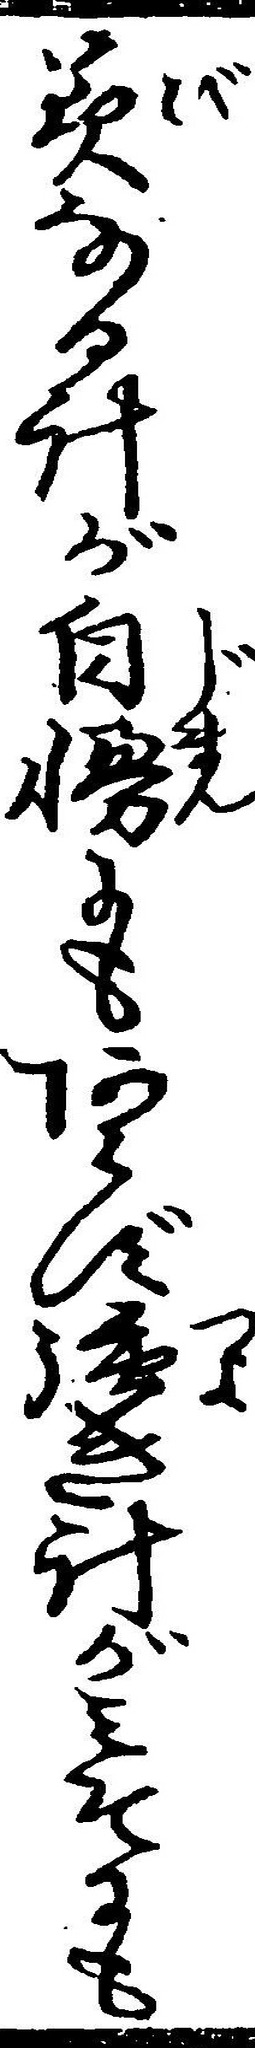美なる計が自慢にもあらず強き計がみそにも

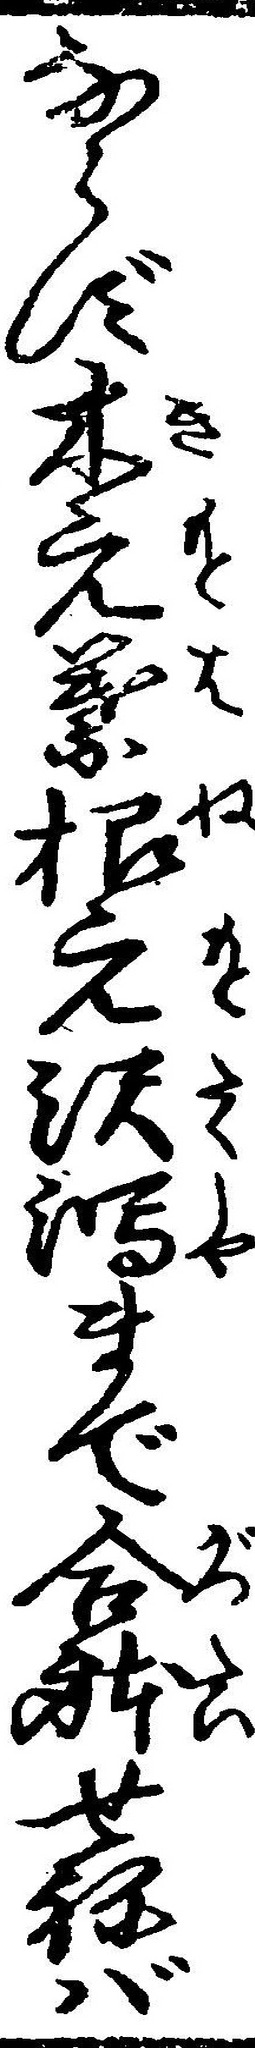ならず木元葉根元沢瀉まで合体せねば
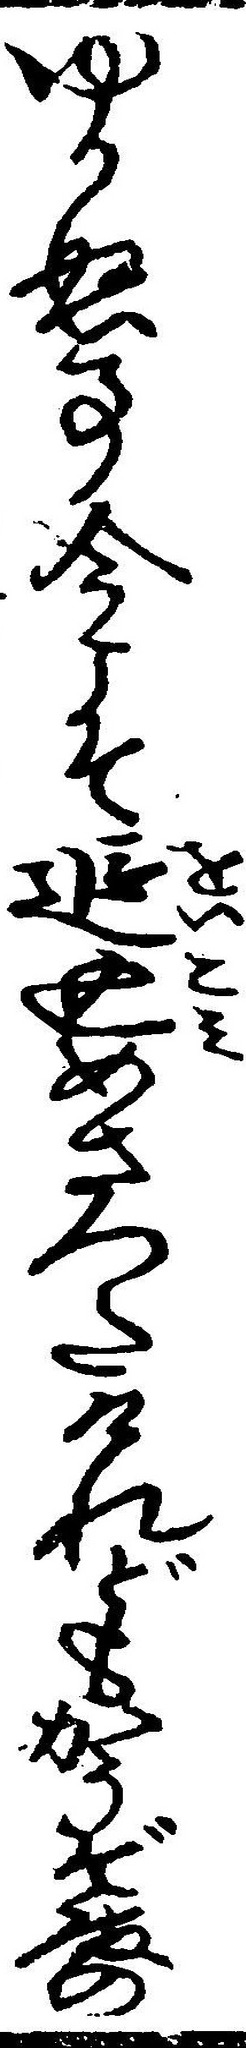ゆかぬ事今こそ追込めさつたけれどもかうぞ殿の
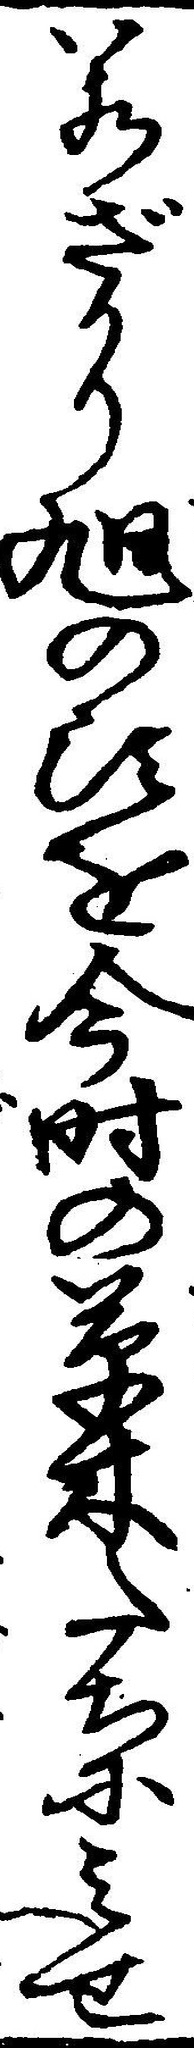若ざかり旭の頃を今時の草木たちにみせ
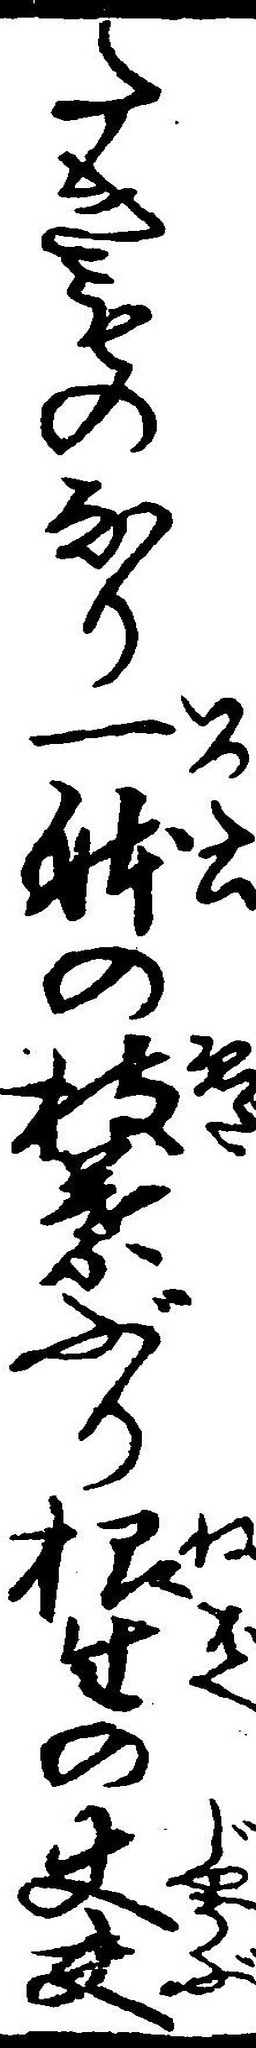たきものなり一体の枝葉ぶり根生の丈夫
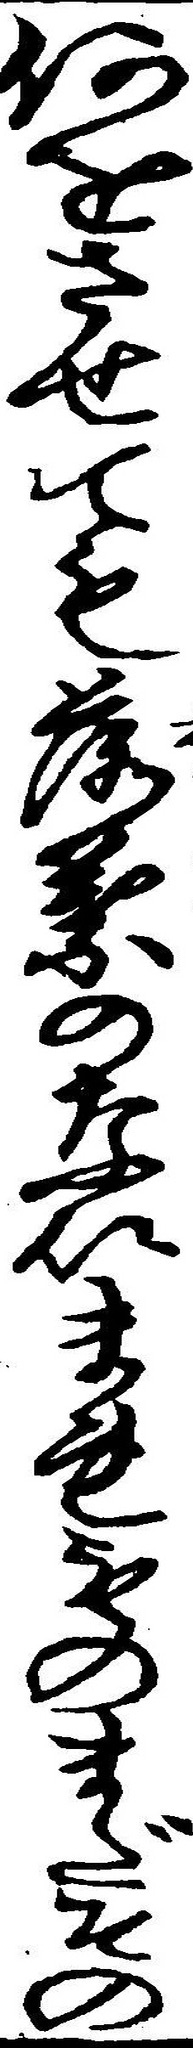何をさせても落葉のないまれものまだその
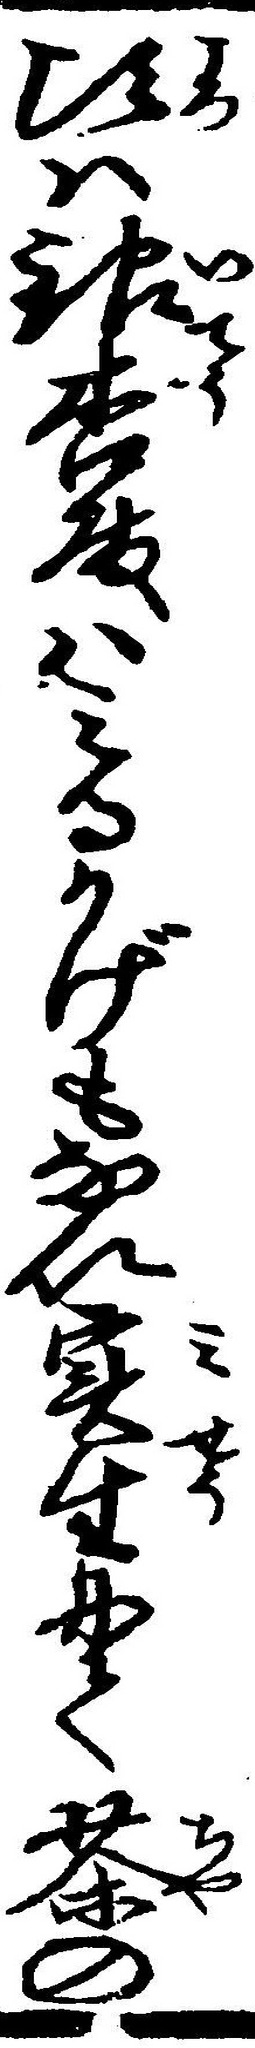頃は銀杏殿はみるかげもない実生にて茶の
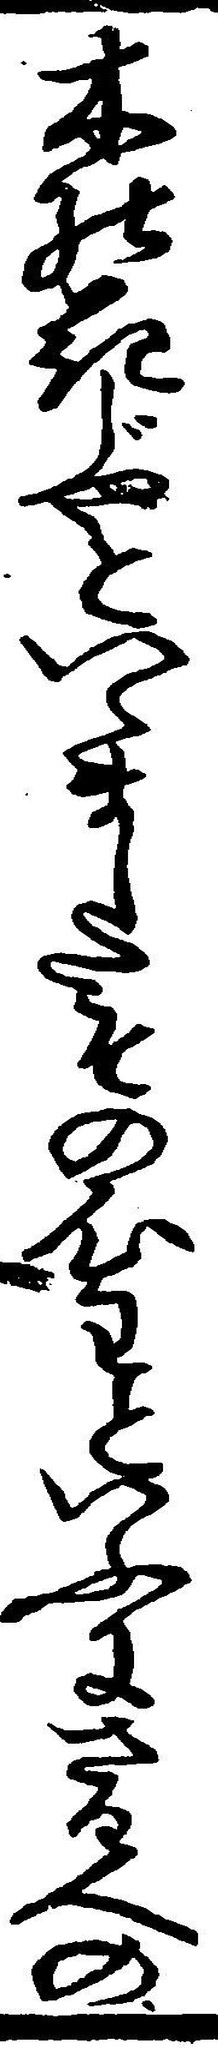木の花じやといゝましたその心はといふにさる人の
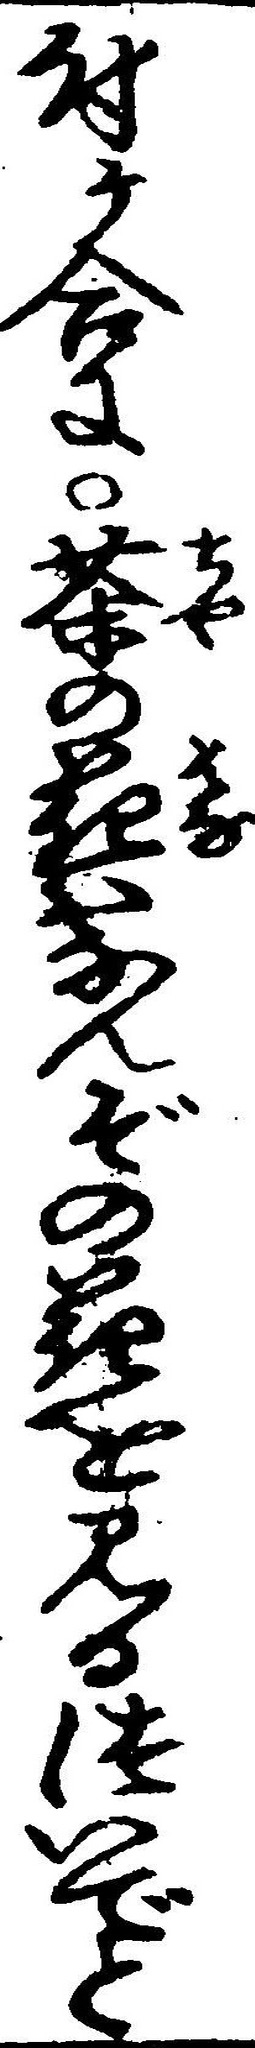付合に○茶の花はなんぞの花を見るついでと
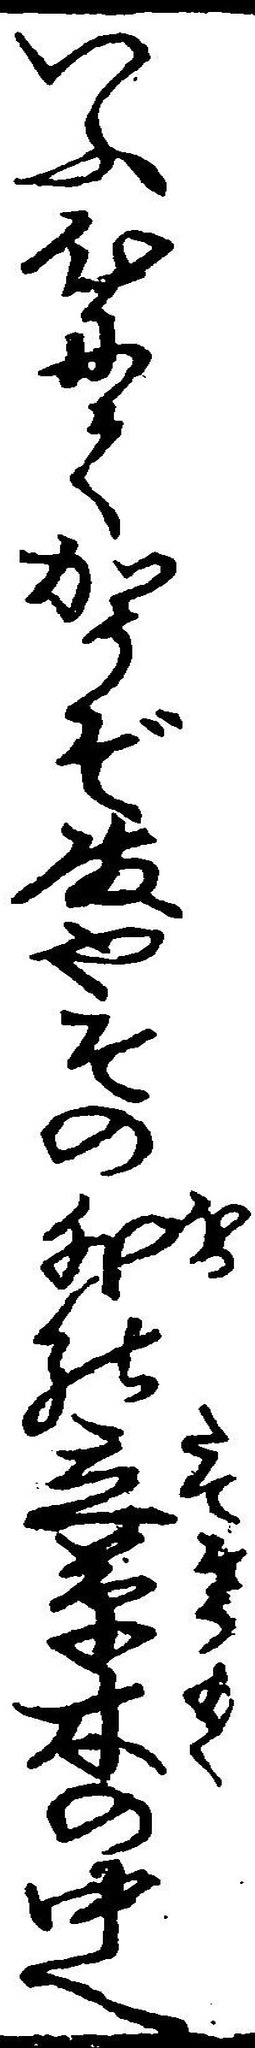いふ心にてかうぞ殿やその外の立草木の中へ
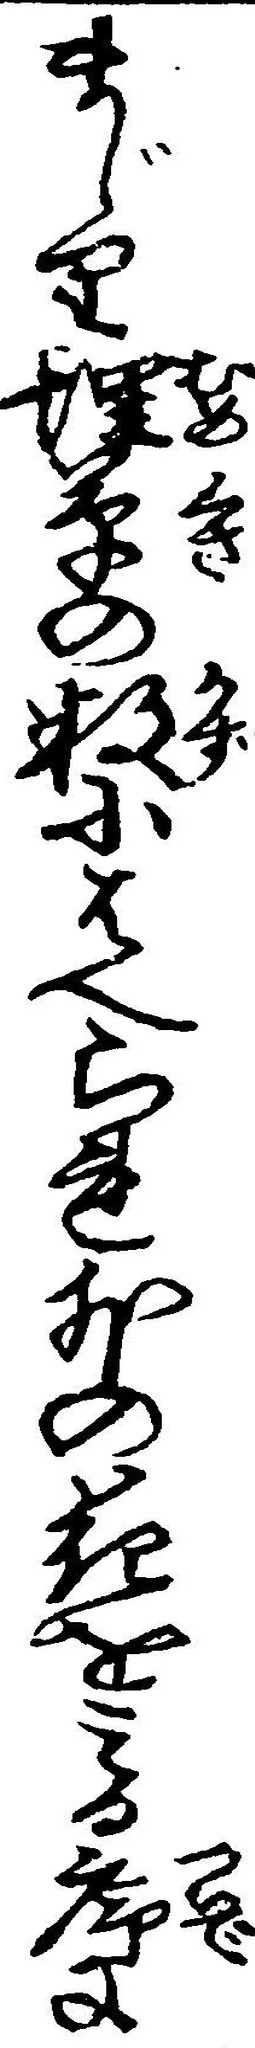まじり埋草の数にはへられ外の花をみる序に
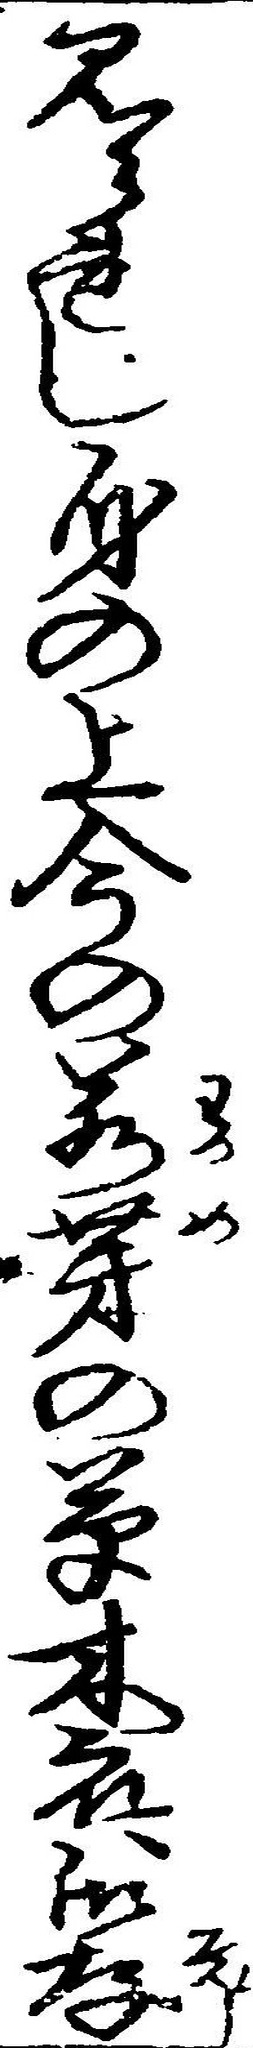見られし身の上今の若芽の草木衆は御存
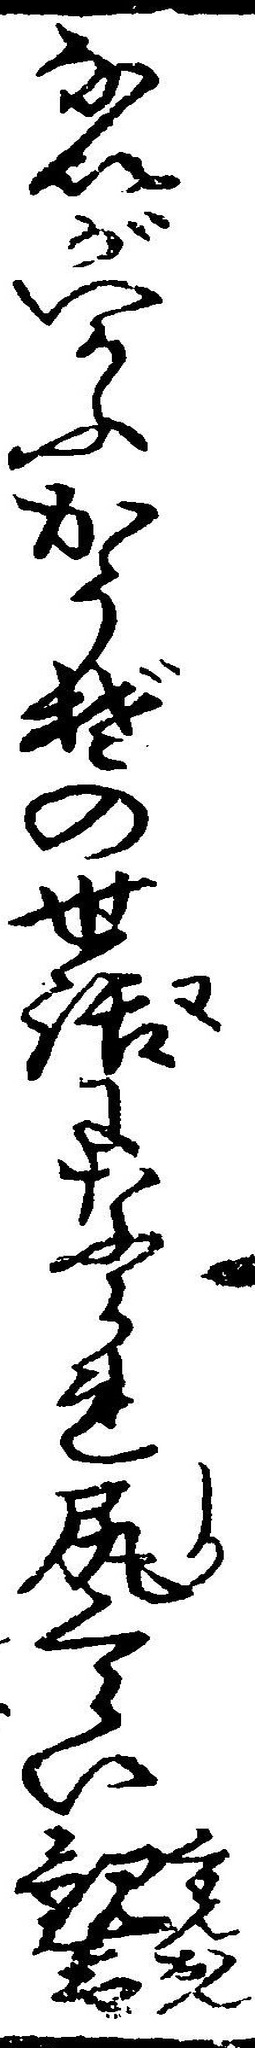ないがいかにかうぞの世話になられ尻くらい観音
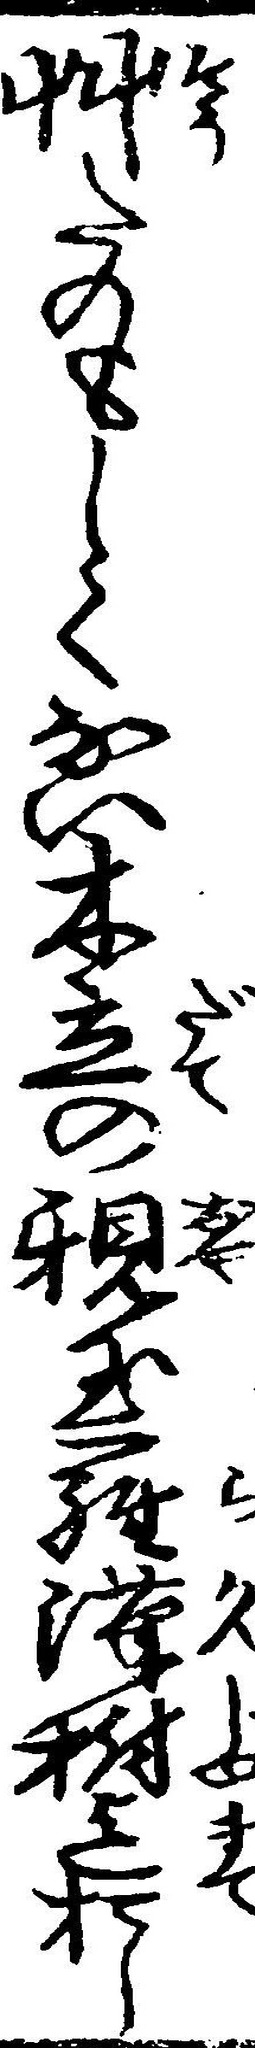草たのもしくない木立の親玉羅漢樹迄おし
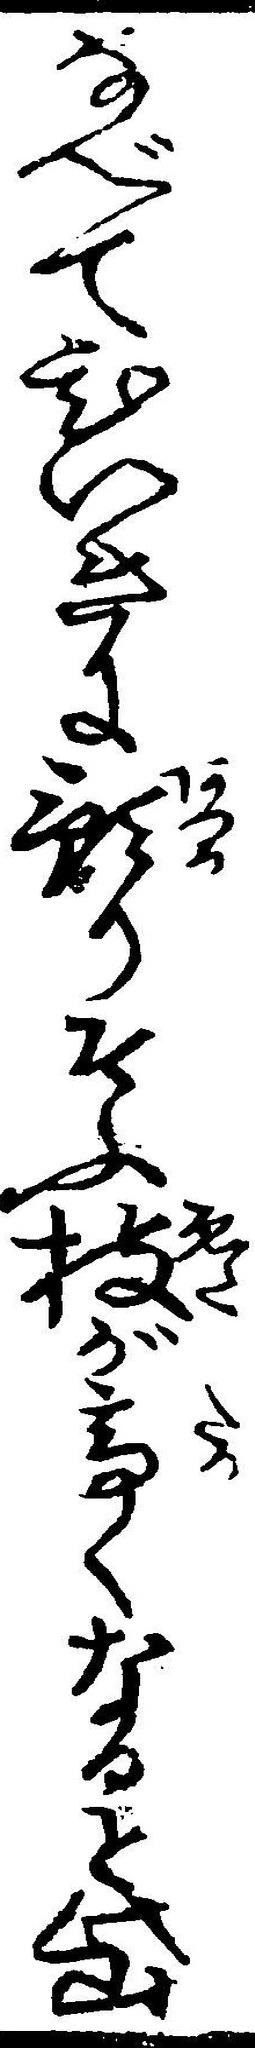なべてひいきに預りそふ枝が高くなると此山

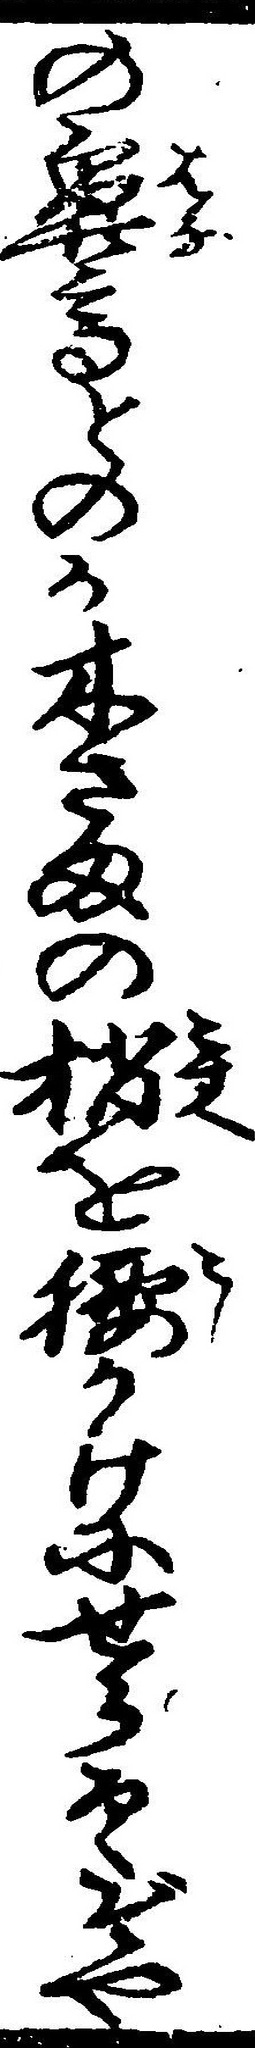の鼻高とのか木さまの梢を腰かけにせらるゝぞや
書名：草木芝居化物退治 / 泉花堂三蝶(十六兵衛)作
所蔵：東京大学総合図書館 General Library in the University of Tokyo, JAPAN
